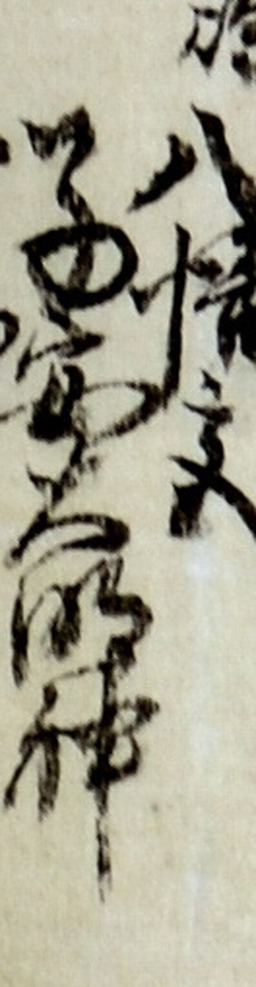子安大明神
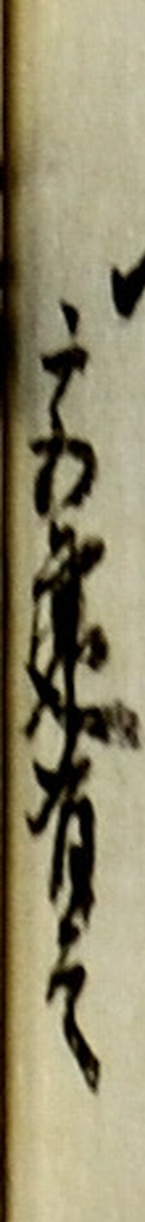宮建有之
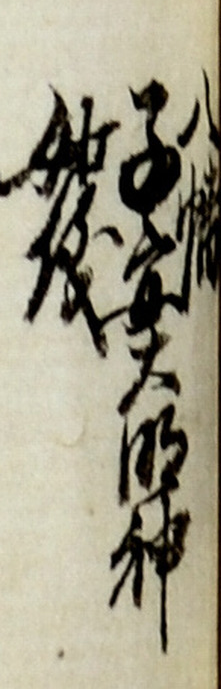子安大明神
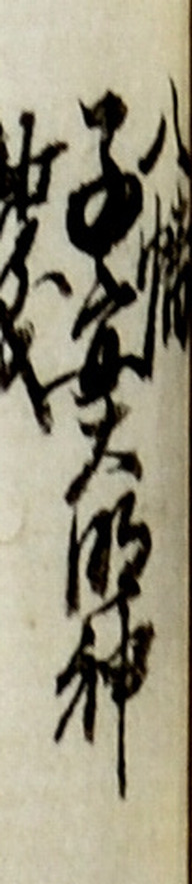子安大明神
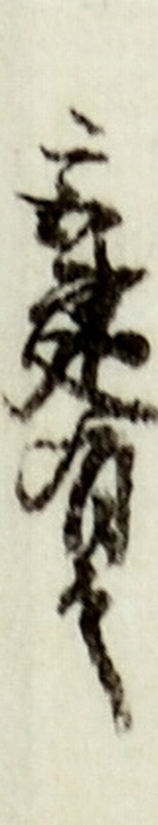宮建有之
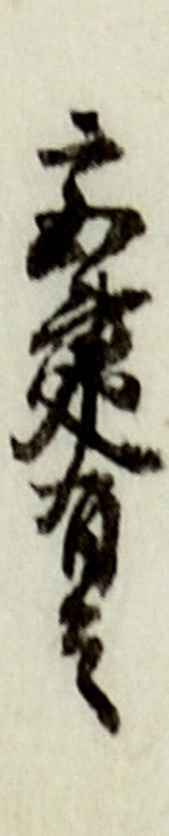宮建有之
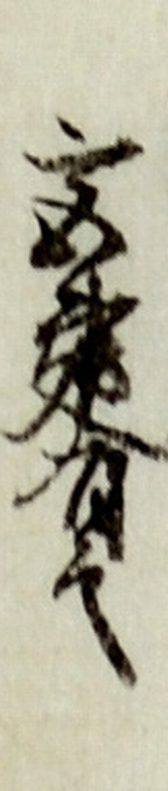宮建有之
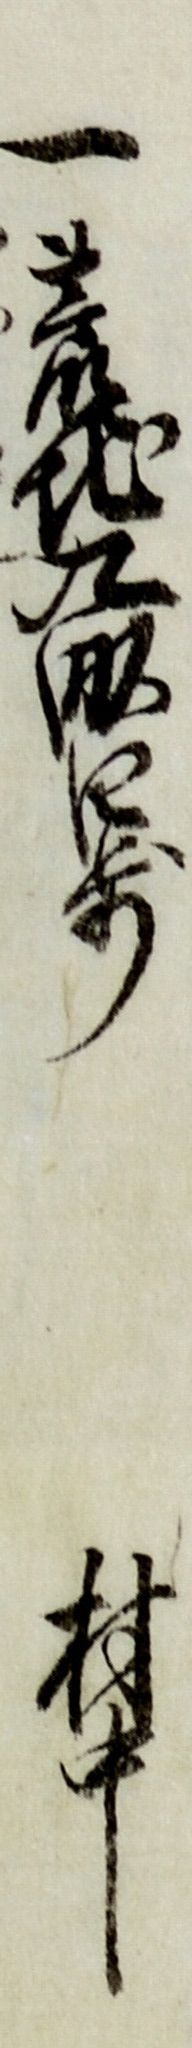一荒地九畝四歩村中

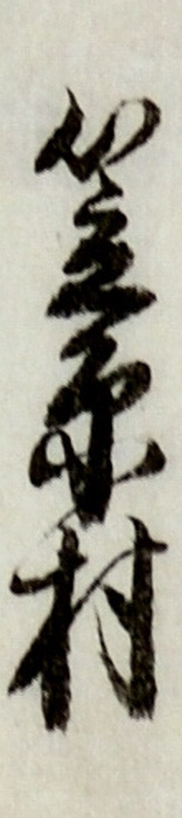笠原村
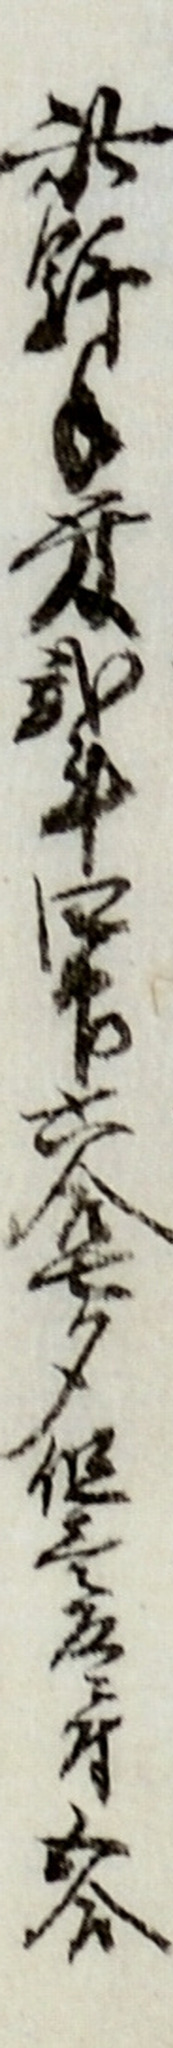此野手米弐斗四升六合七勺但壱反ニ付五合
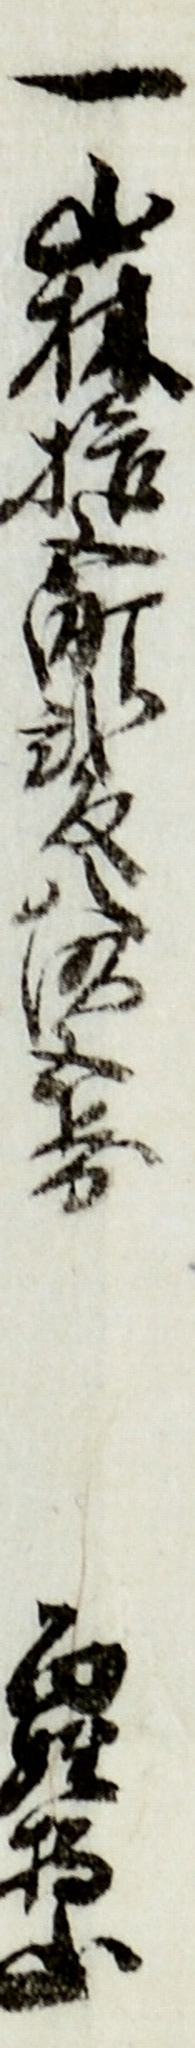一山林拾五町弐反八畝五歩百姓持山
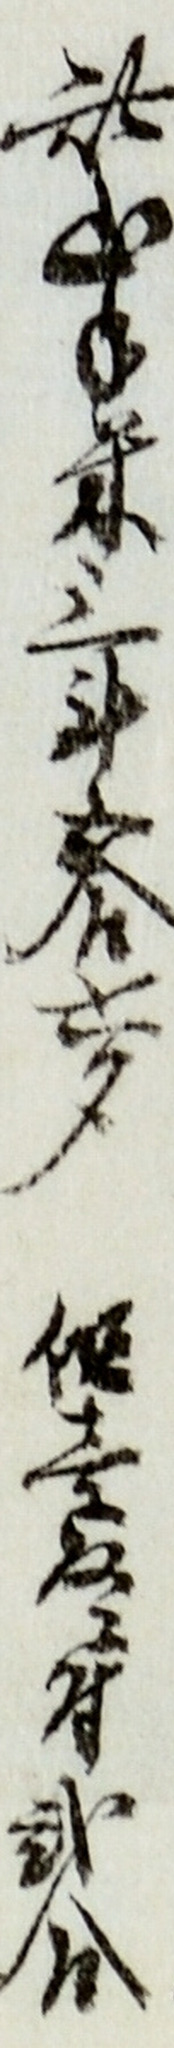此山手米三斗五合六勺但壱反ニ付弐合
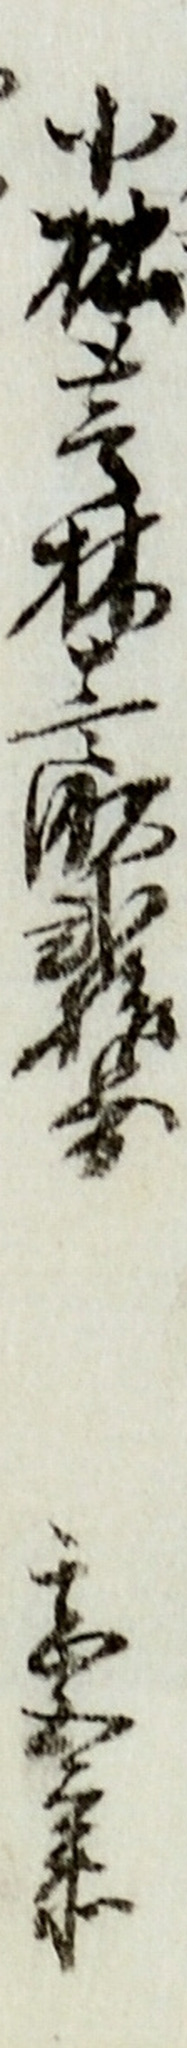小松芝林壱畝弐拾歩甚五兵衛
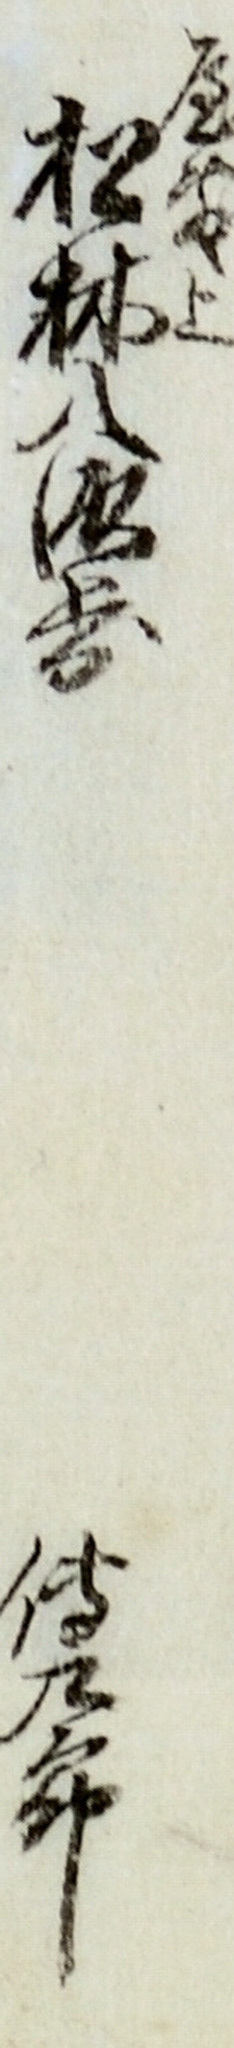松林八畝歩伝九郎
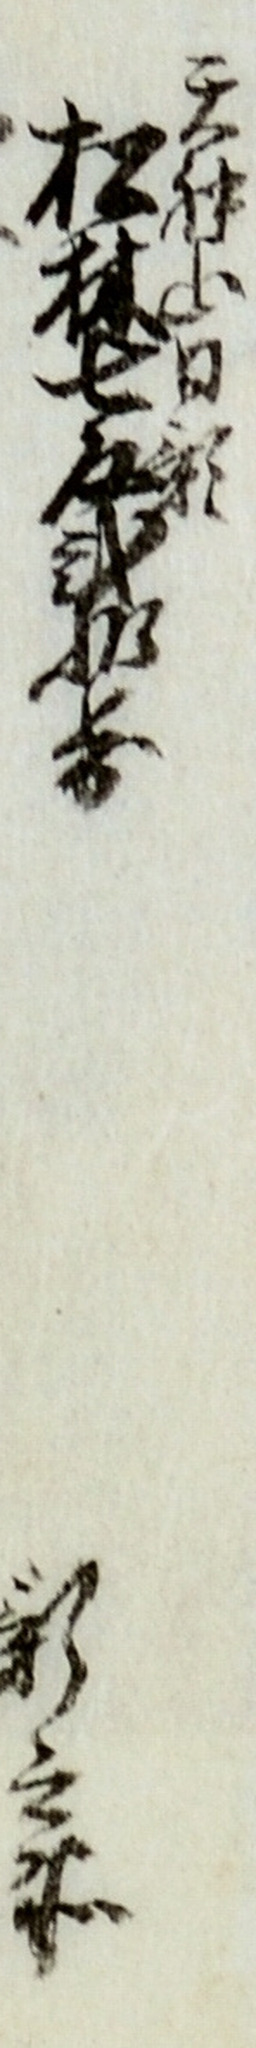松林七反弐拾歩新兵衛
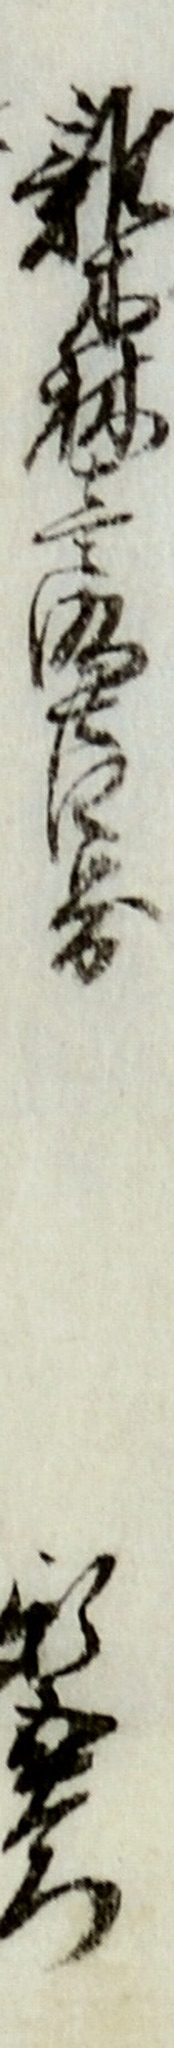雑木林壱畝廿四歩新五右衛門
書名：御領分中山林社地手控
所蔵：伊那市立高遠町図書館・合同会社AMANE
